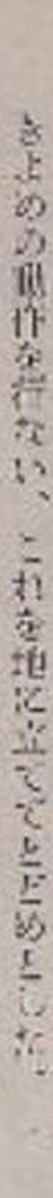きよめの動作を行ない、これを地に立ててとどめとした。
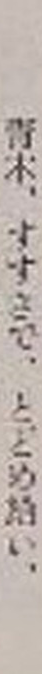青木、すすきで、とどめ給い、
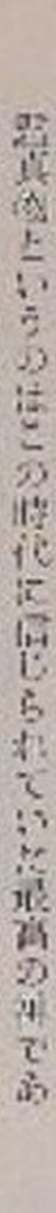君真物というのはこの時代に信じられていた最高の神であ
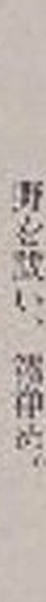野を祓い、澪浄め。
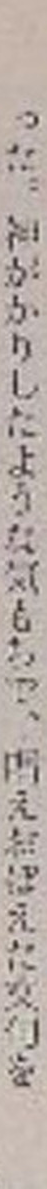った。神がかりしたような気もちで、唱えおぼえた文句を
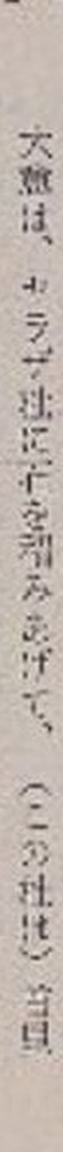大意は、ヤラザ杜に石を積みあげて、(この杜は)首里
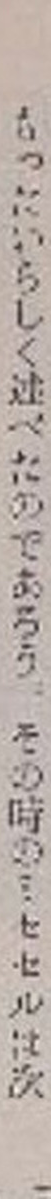もったいらしく述べたのであろう。その時のミセセルは次
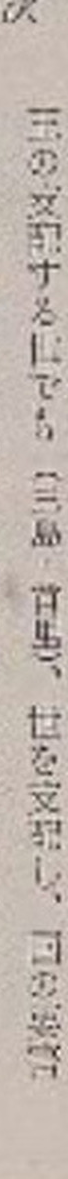王の支配する世でも(三島首里)、世を支配し、国の要害
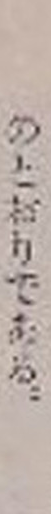のとおりである。
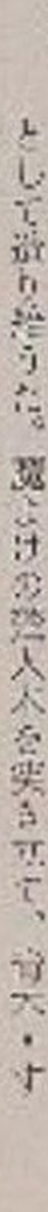として造り給うた。魔よけの楚人木を突き立て、青木・す
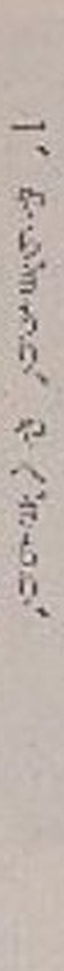一、やらざもり、やへざもり、
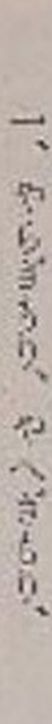一、やらざもり、やへざもり、
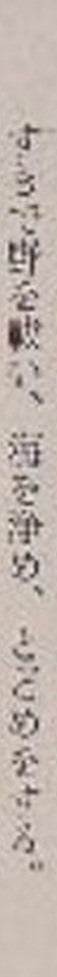すきで野を祓い、海を浄め、とどめをする。
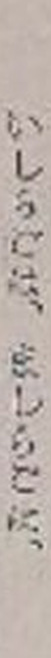いしらごは、ましらごは、
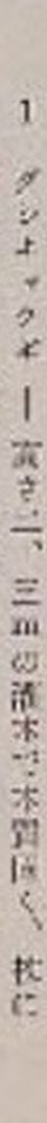１ダシキャクギ―高さ二、三ｍの灌木で木質堅く、杖に
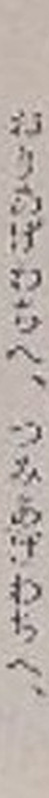おりあげわちへ、つみあげわちへ、
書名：沖縄口承文芸
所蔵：University of the Ryukyus Library
